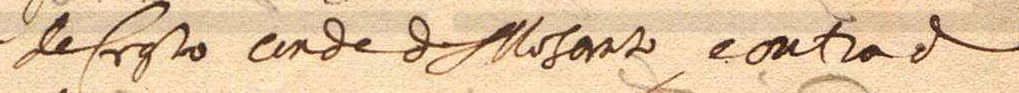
de Crasto conde de Mosanto, e outra de
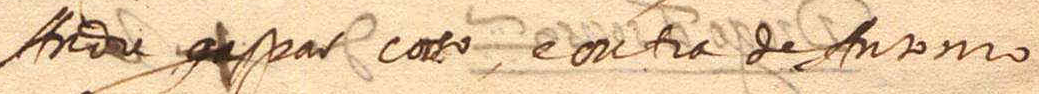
Andre gaspar corso, e outra de Antonio
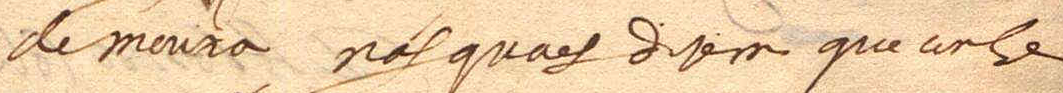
de moura, nas quaes dizem que conhe
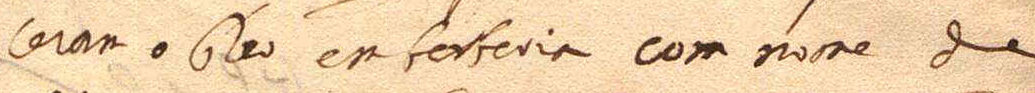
ceram o Reo em berberia com nome de
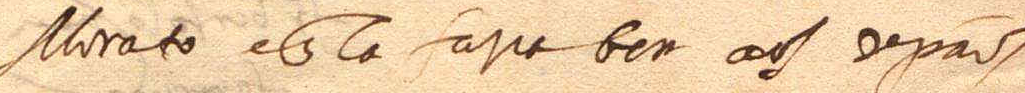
Morato e q̄ fazia bem aos xpãos
